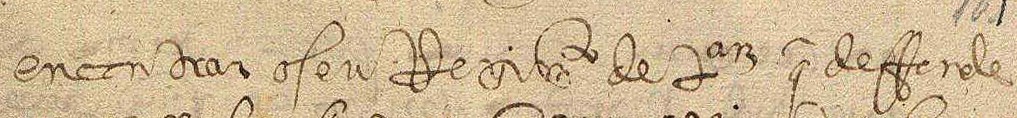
encontrar o seu Regimto de tam q̄ deffende
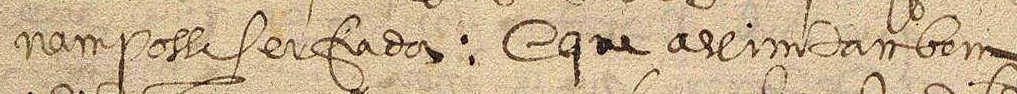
nam possa ser fiador: e que assim tambem
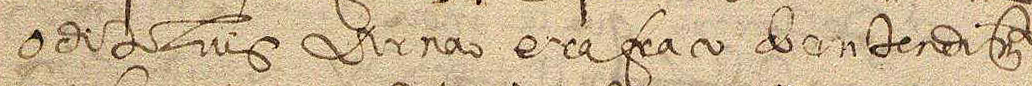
o dito Luis Arnao era fraco do entendimto
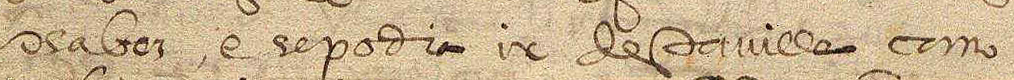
e saber, e se podia ir desta uilla como
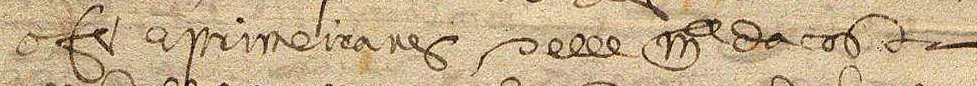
o fes a primeira ues e elle mel da costa
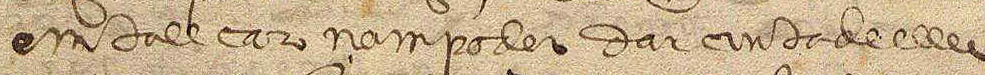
em tall cazo nam poder dar conta de ellee
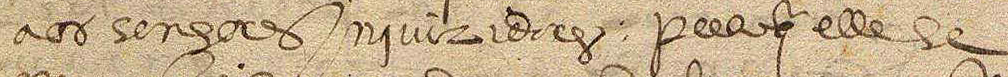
aos senhores Jnquizidores pello q̄ elle se
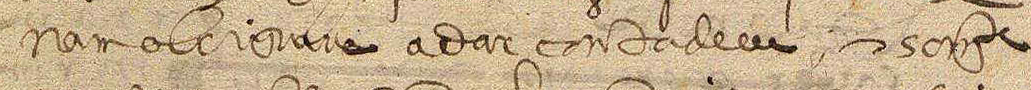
nam obriguaua a dar conta delle, e somte
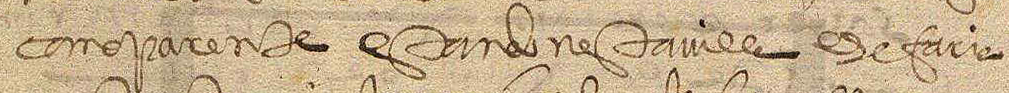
como parente estando nesta uilla lhe faria
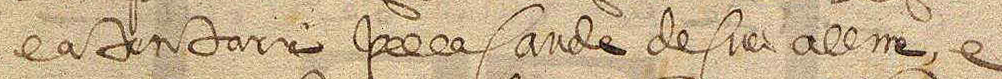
e atentaria pella saude de sua allma, e
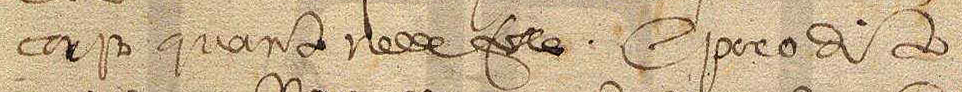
corpo quanto nelle fosse. E por o dito
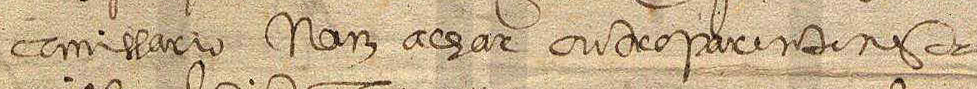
comissario nem achar outro parente nesta
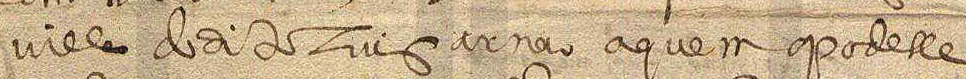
uilla do dito Luis arnao a quem o podesse
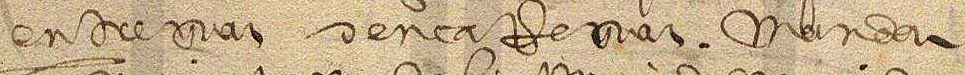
entreguar e encaReguar. mandou
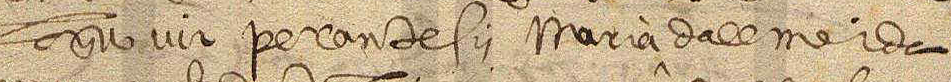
Loguo uir perante sy maria dallmeida
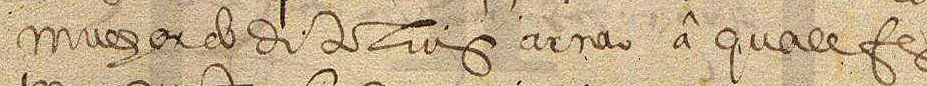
mulher do dito Luis arnao â quall fes
